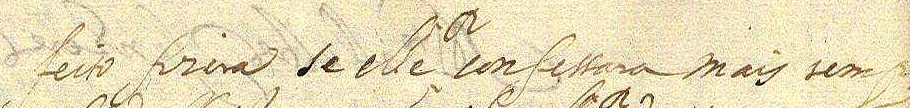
feito fizera se elle, R confessara mais semp
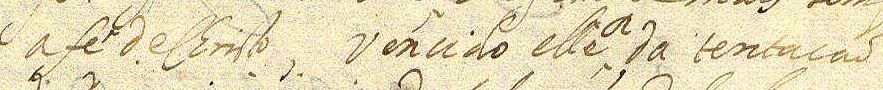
a fé de Christo, vencido elle, R da tentaçaõ
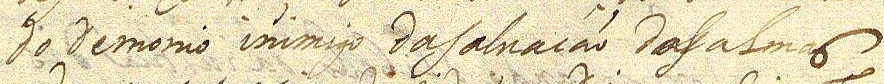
do demonio inimigo da saluaçaõ das almas
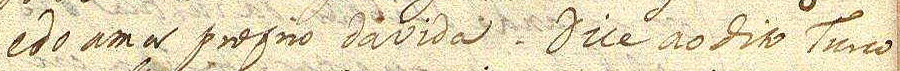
e do amor proprio da vida. Dice ao dito Turco
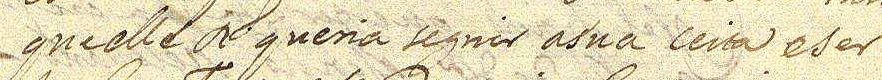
que elle R queria seguir a sua ceita e ser
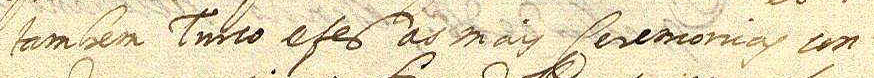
tambem Turco e fes as mais Ceremonias con
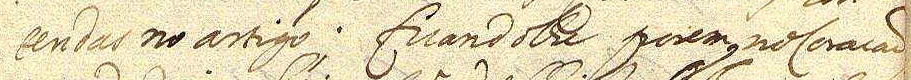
teudas no artigo; ficandolhe porem no Coraçaõ
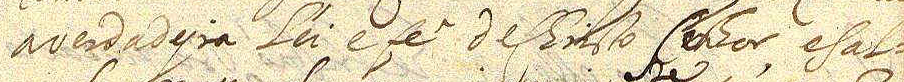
a verdadeira Lei e fé de Christo Senhor, e sal
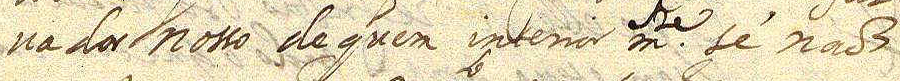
uador nosso de quem interiorm.te se naõ
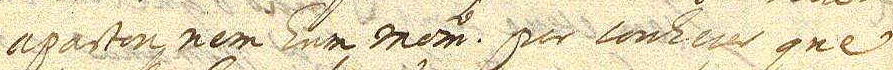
apartou nem hum momto. por conhecer que
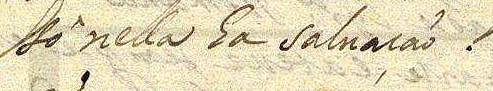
só nella ha saluaçaõ.
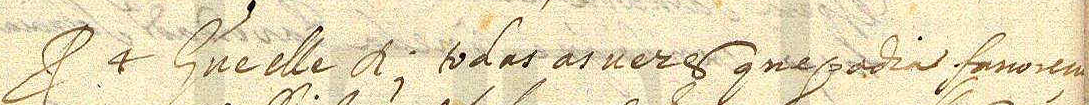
ꝓ 4 Que elle R. todas as uezes que podia fauorece
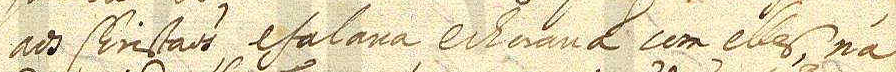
aos Christaõs, e falaua e choraua com elles, na
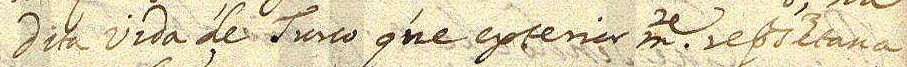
dita vida de Turco que exteriorm.te se p̄sētaua
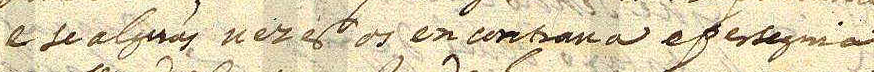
e se alguās uezes os encontraua e perseguia
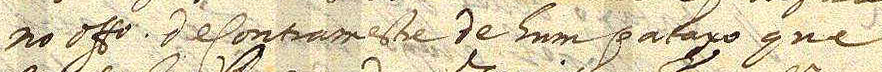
no offo. de Contramestre de hum pataxo que
